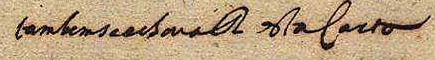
tambem se achou a R esta Carta
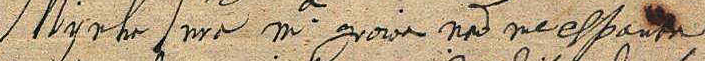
Mynha Snrā m.a groioa naõ me espanta
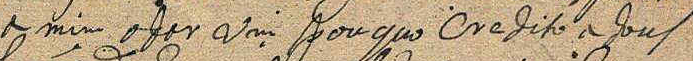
a mim o dar Vm pouquo Credito a dous
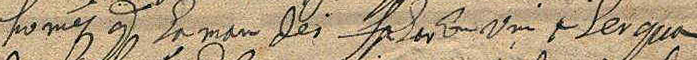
homēs q̄ la mandei falar com vm aserqua
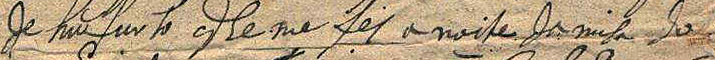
de hū furto q̄ se me fes a noite da misa do
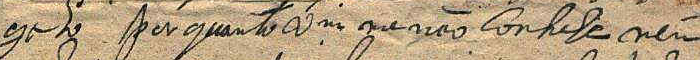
galo porquanto vm me não Conhese nem
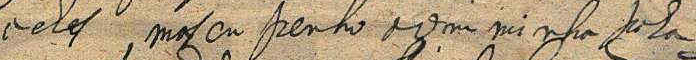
a eles, mas eu penho a vm minha pala
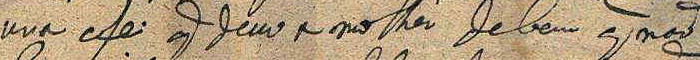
ura e fe q̄ deuo a molher de bem q̄ naõ
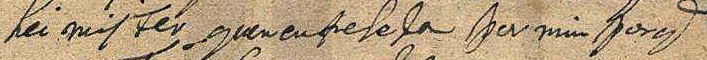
hei mister quem entreseda por mim porq̄
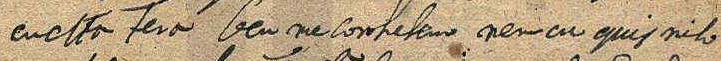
en esta tera bem me conhesem nem eu quis niso
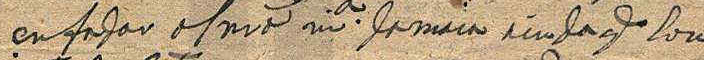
enfadar a snrā m.a da maia ainda q̄ sou
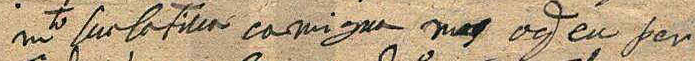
mto sua catiua e amigua mas o q̄ eu per
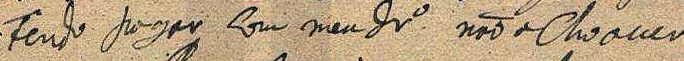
tendo pagar com meu dro naõ aCho auer
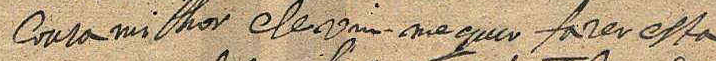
Couza milhor e se vm me quer fazer esta
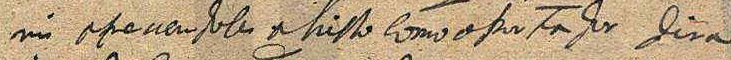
m atreuentose a hisso como o portador dira
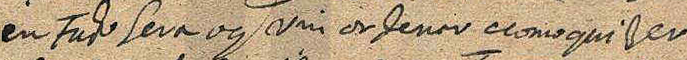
en tudo sera o q̄ vm ordenar e como quizer
